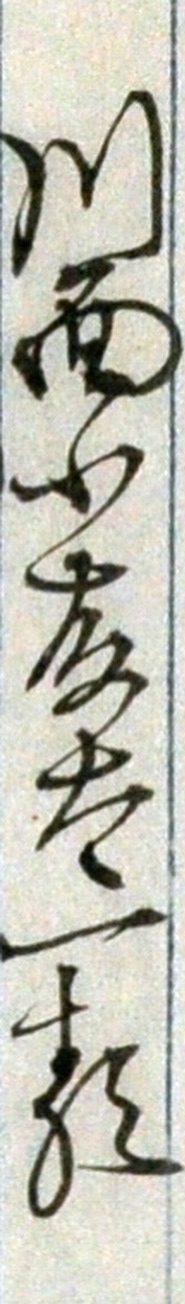川面小藤太一類
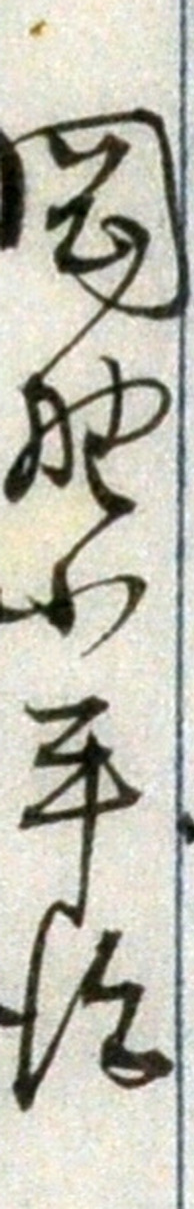岡野小平治
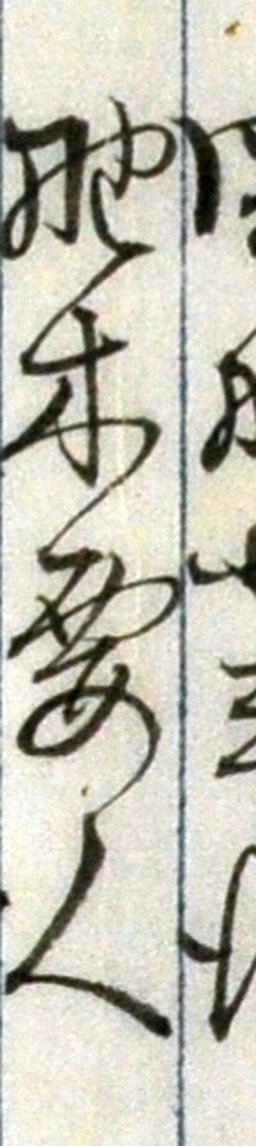野木要人
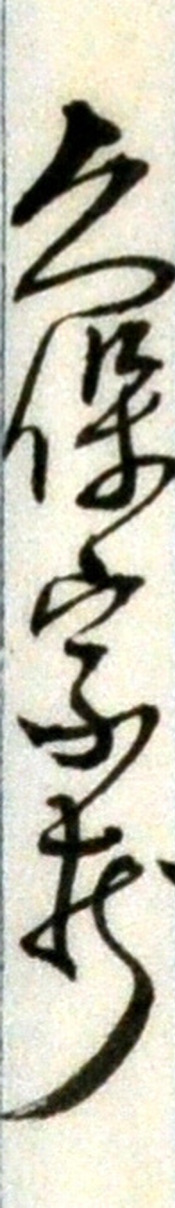久保宗蔵
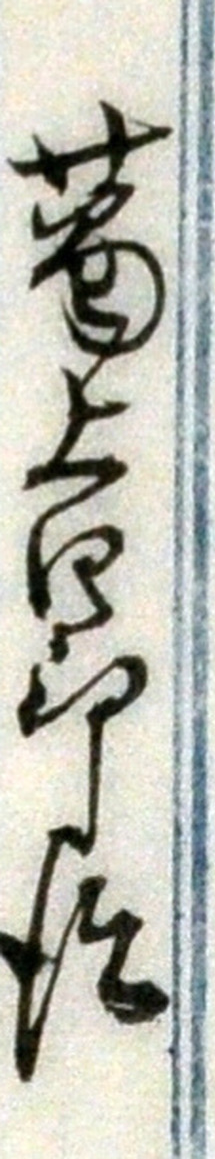葛上四郎治
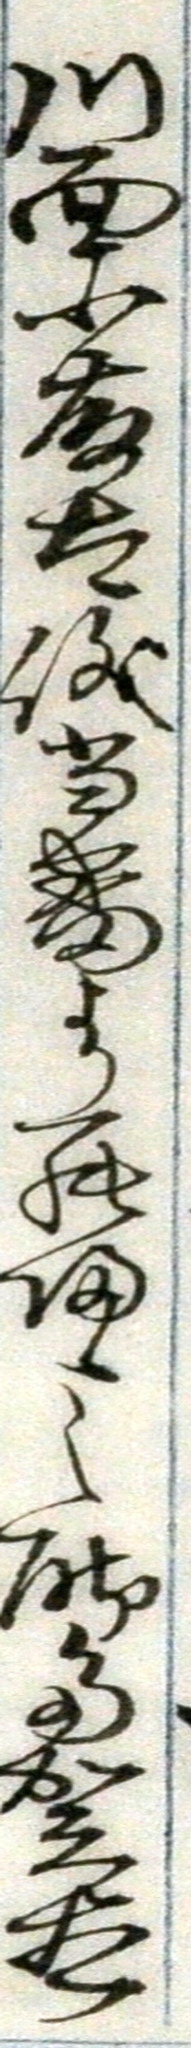川面小藤太儀当番より罷帰候之砌多賀谷
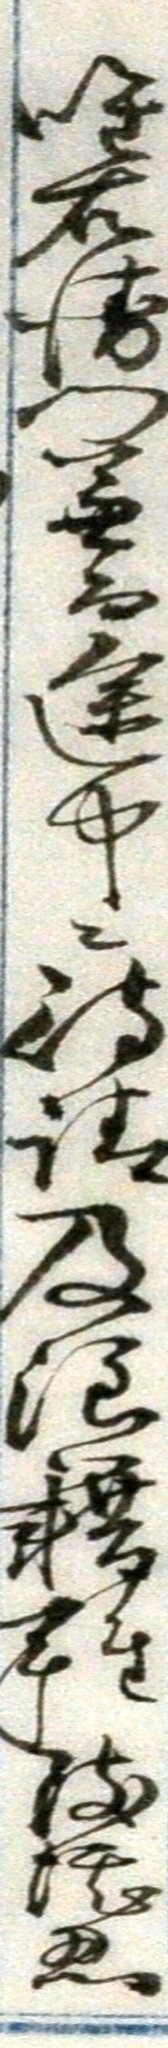唯右衛門兼而途中ニ待請及狼藉難致堪忍
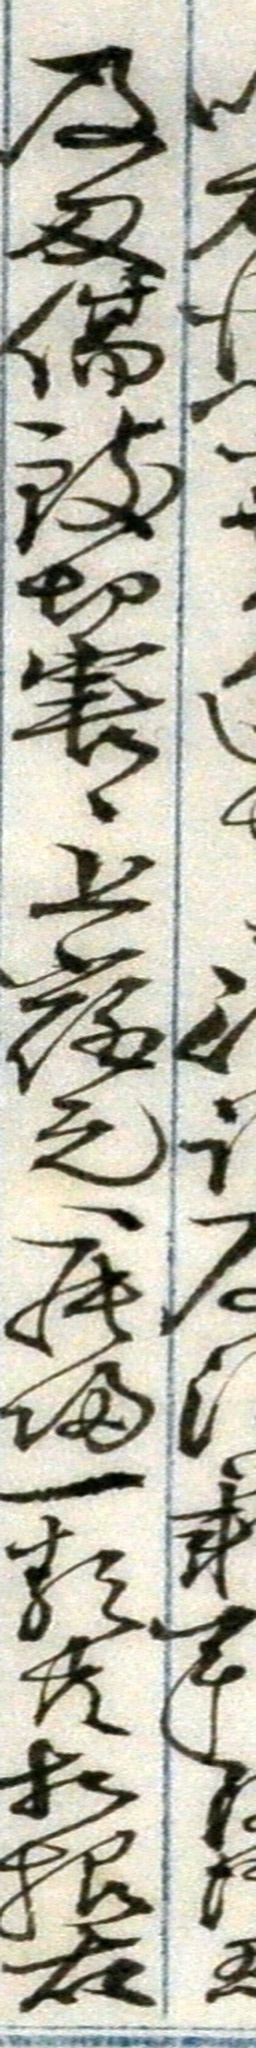及刃傷致切害候上宿元へ罷帰一類共相招右
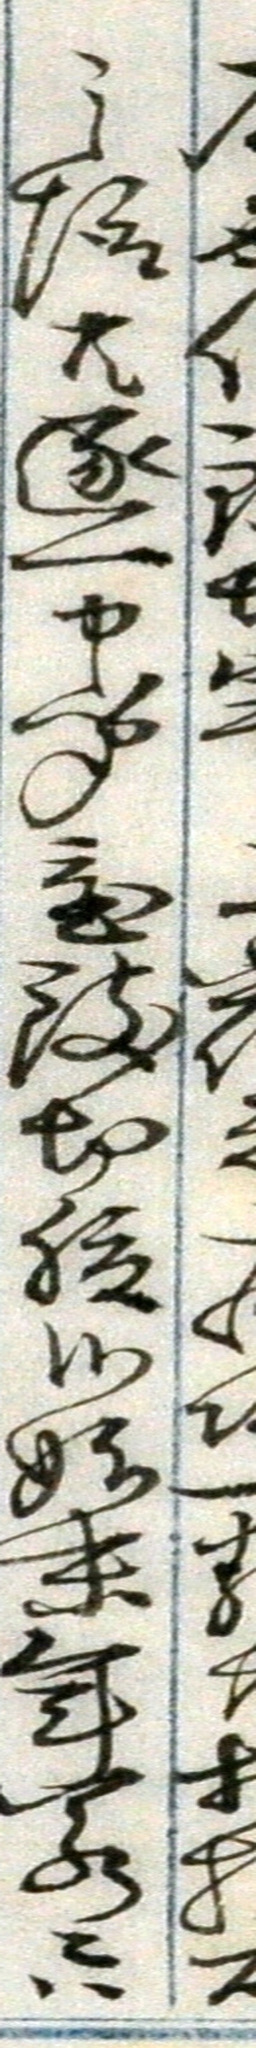趣共逐一申聞置致切腹候始末年若ニハ
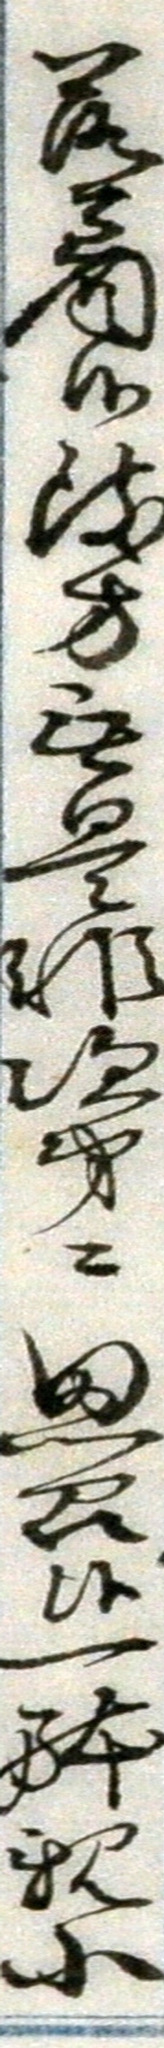落着候致方無是非次第ニ思召候一躰親小
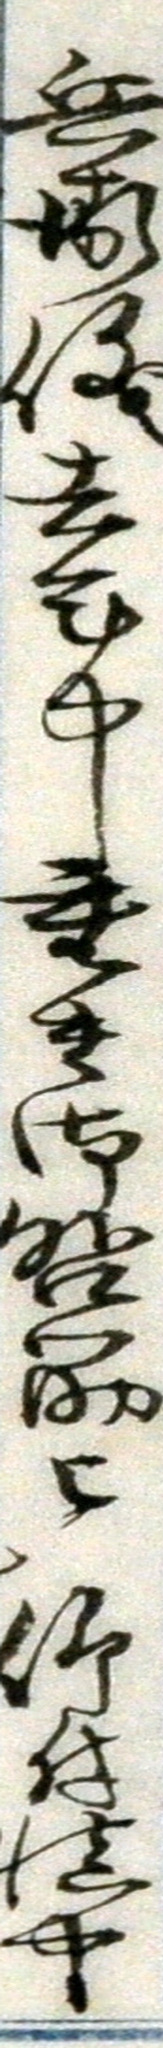兵衛儀去年中重き御咎筋被仰付慎中
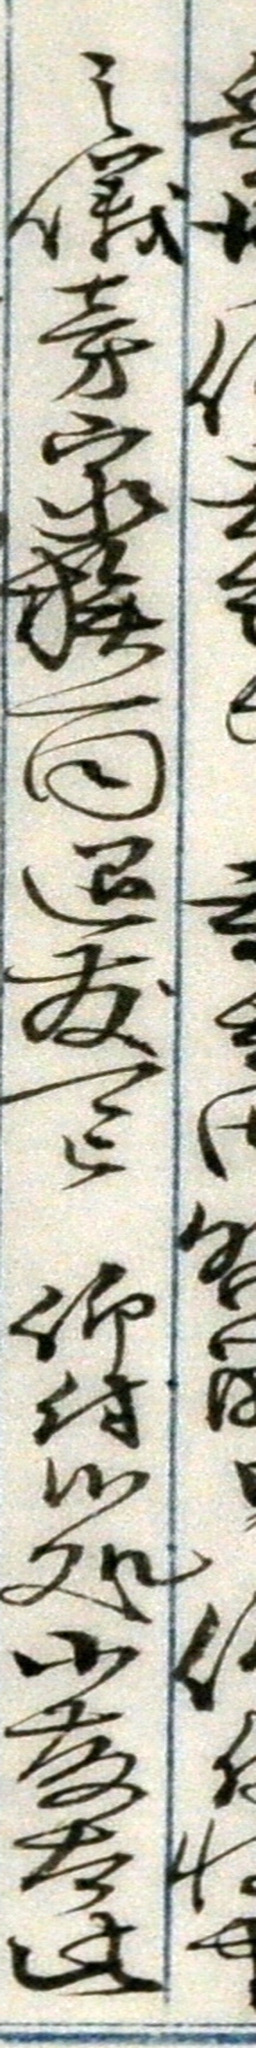之儀旁家族一同退散可被仰付候処小藤太此
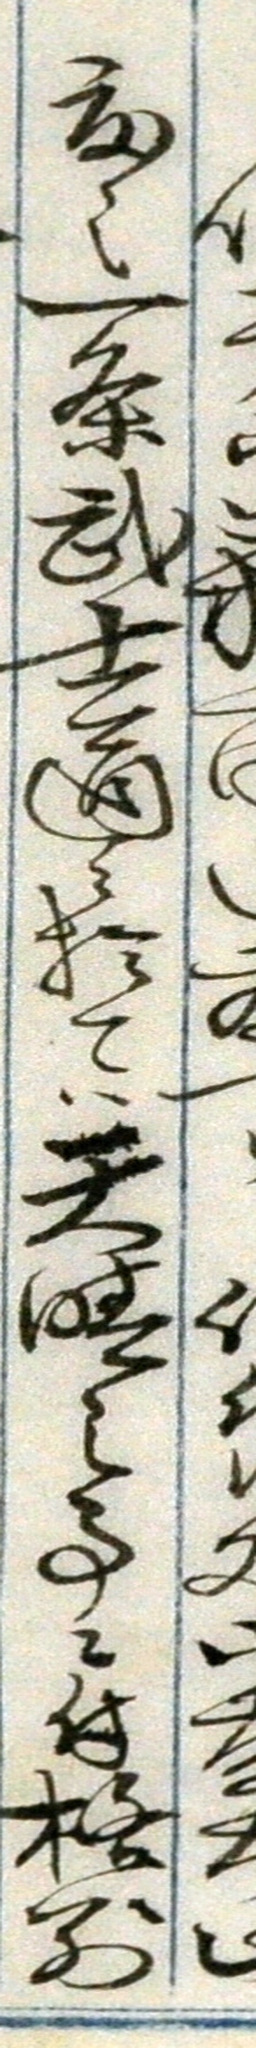度之一条武士道ニ於てハ天晴之事ニ付格別
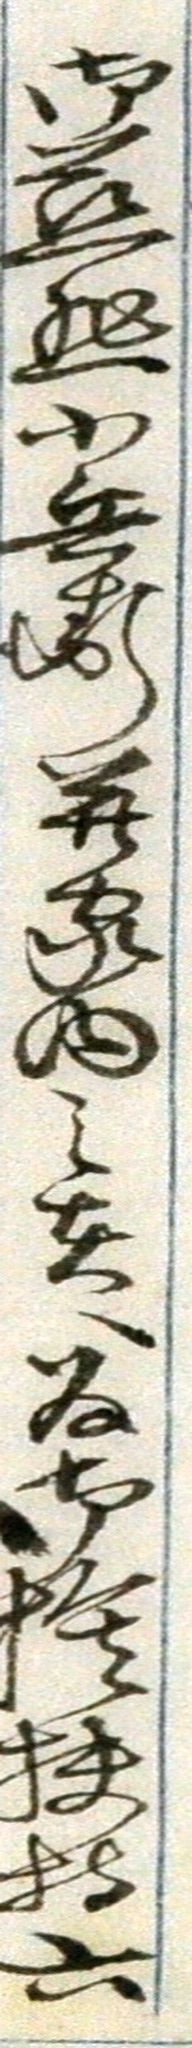御慈悲小兵衛幷家内之者へ為御捨扶持六
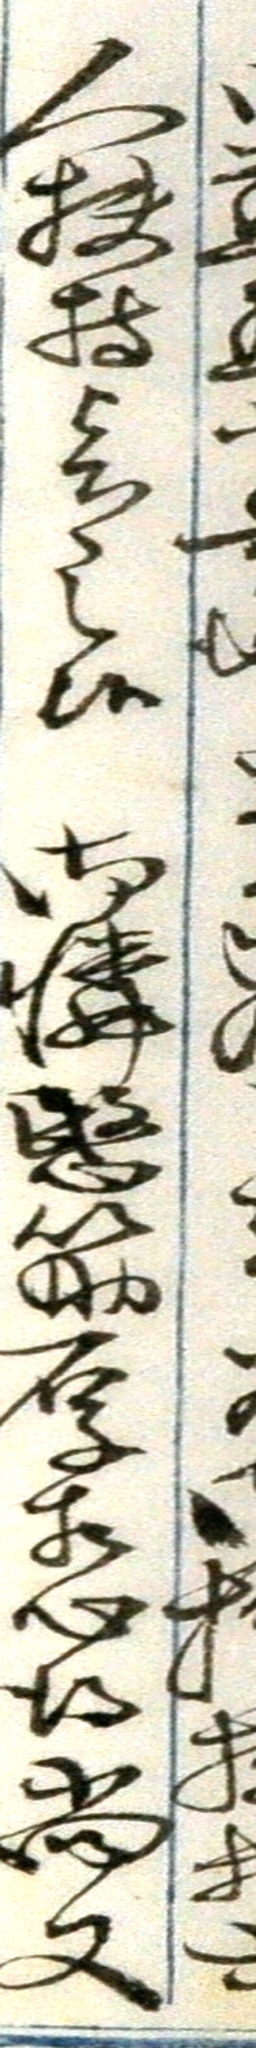人扶持被下之候御憐愍筋厚相心得尚又

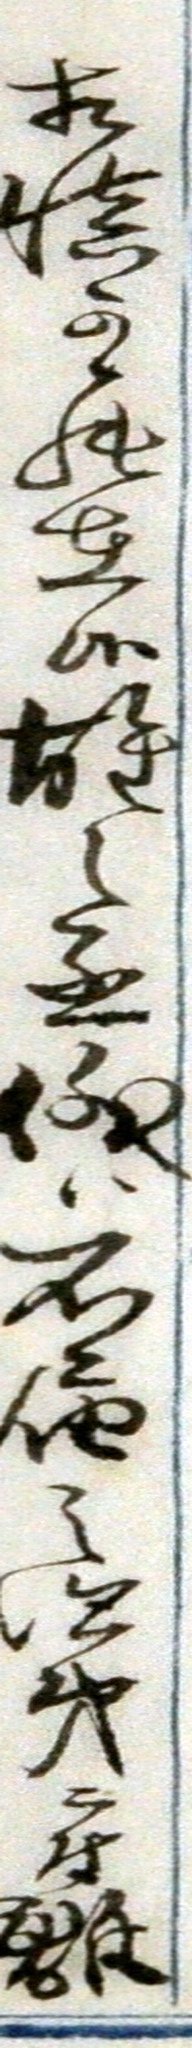相慎可罷在候雄之丞儀ハ不届之次第ニ付離
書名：川面小藤太子細有之多賀谷唯右衛門ヲ打果候一件
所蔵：伊那市立高遠町図書館・合同会社AMANE
